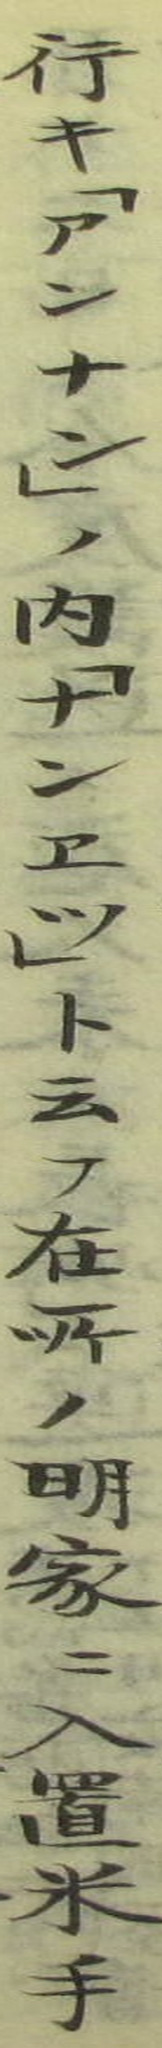行キ「アンナン」ノ内「ナンヱツ」ト云フ在所ノ明家ニ入置米手
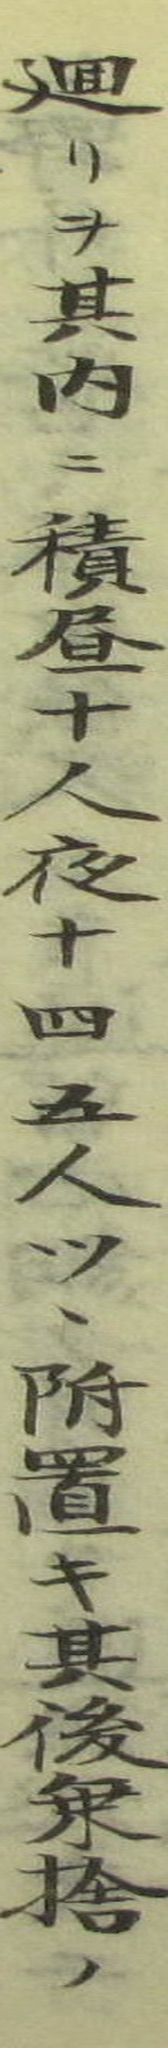廻リヲ其内ニ積昼十人夜十四五人ツヽ附置キ其後乗捨ノ
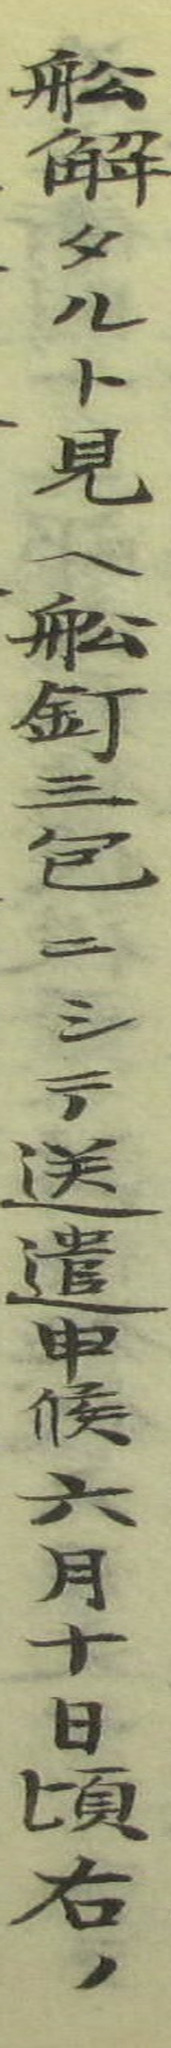舩解タルト見ヘ舩釘三包ニシテ送遣申候六月十日頃右ノ
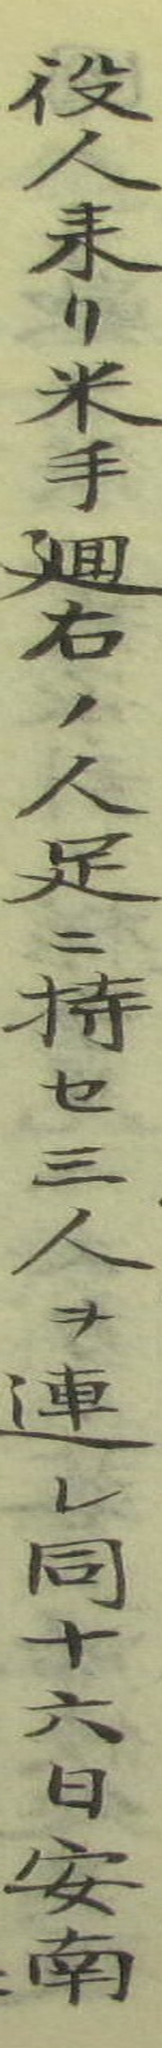役人来リ米手廻右ノ人足ニ持セ三人ヲ連レ同十六日安南
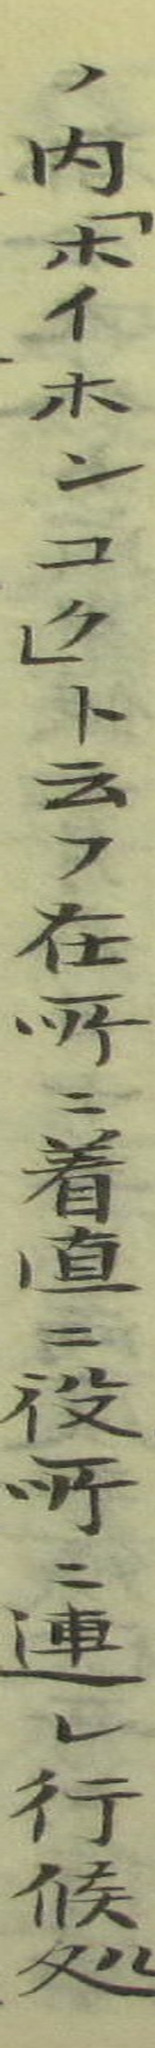ノ内「ホイホンコク」ト云フ在所ニ着直ニ役所ニ連レ行候処
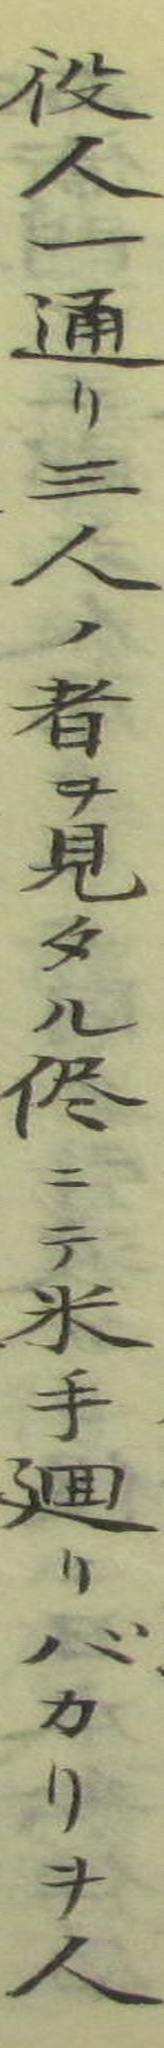役人一通リ三人ノ者ヲ見タル侭ニテ米手廻リバカリヲ人
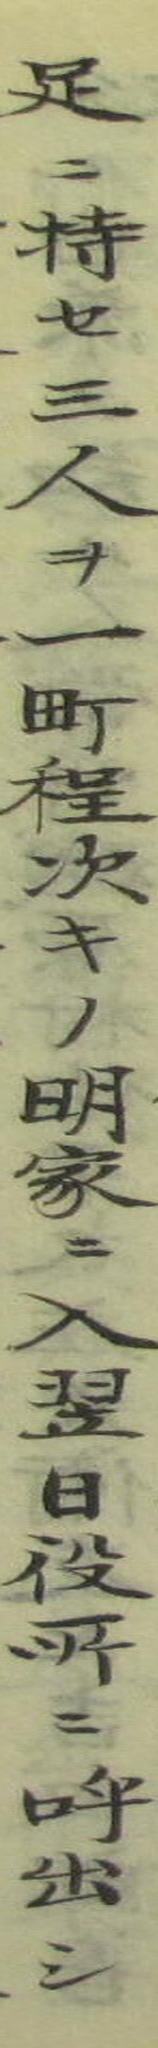足ニ持セ三人ヲ一町程次キノ明家ニ入翌日役所ニ呼出シ
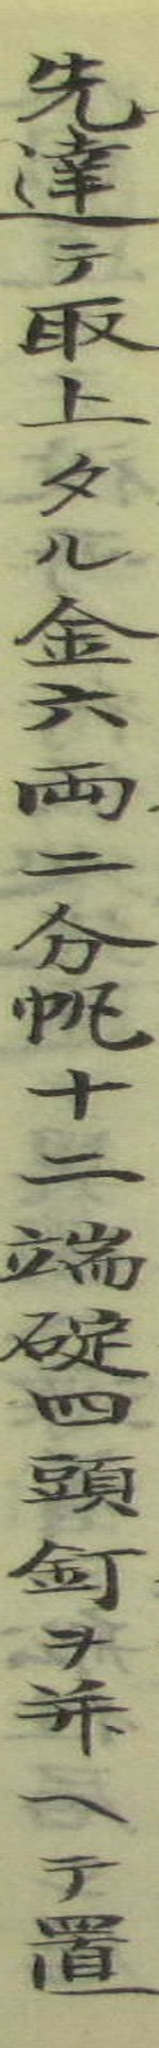先達テ取上タル金六両二分帆十二端碇四頭釘ヲ幷ヘテ置
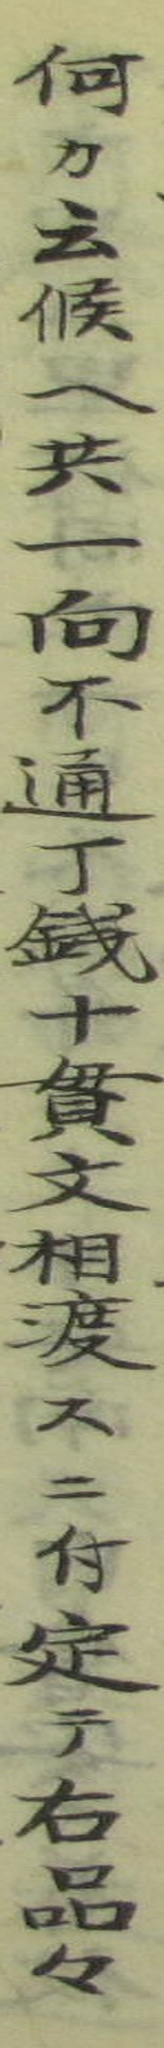何カ云候ヘ共一向不通丁銭十貫文相渡スニ付定テ右品々
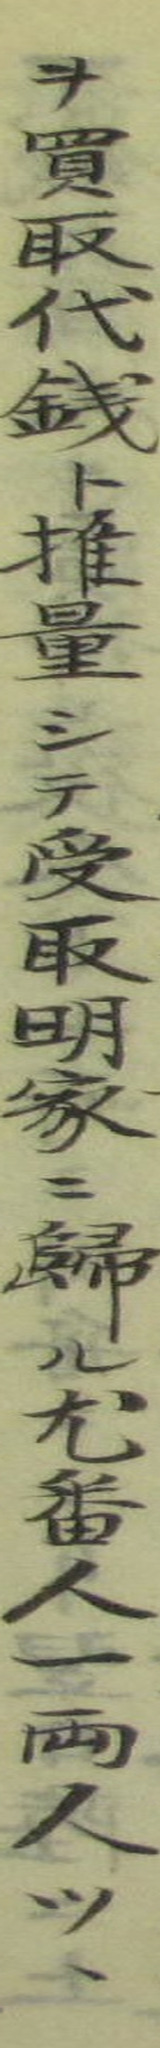ヲ買取代銭ト推量シテ受取明家ニ歸ル尤番人一両人ツヽ
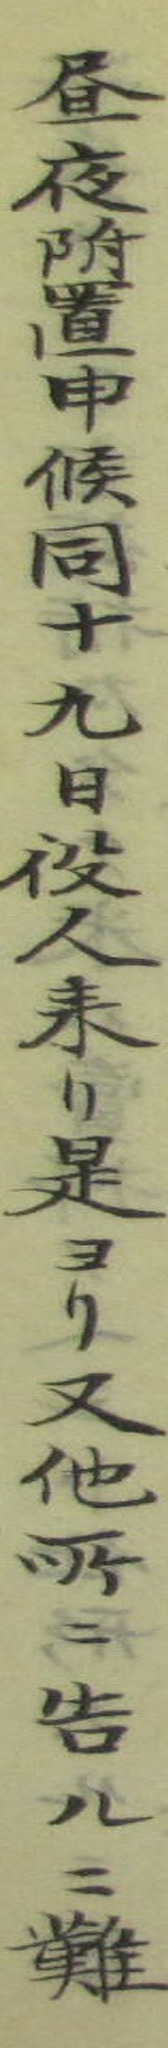昼夜附置申候同十九日役人来リ是ヨリ又他所ニ告ルニ難

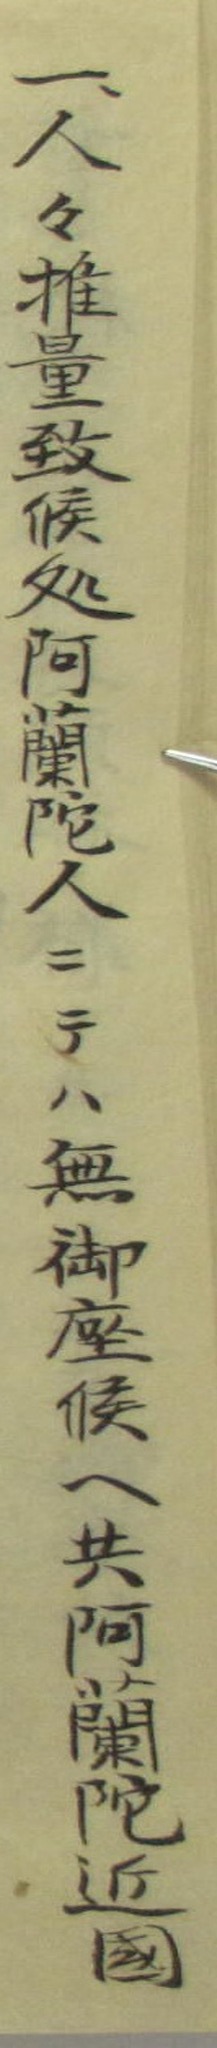一人々推量致候処阿蘭陀人ニテハ無御座候ヘ共阿蘭陀近國
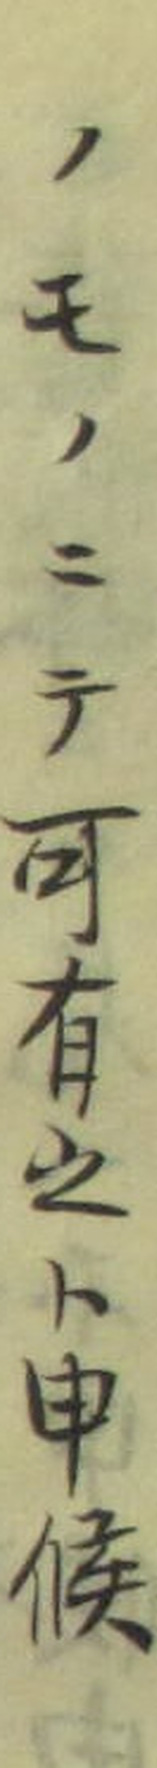ノモノニテ可有之ト申候

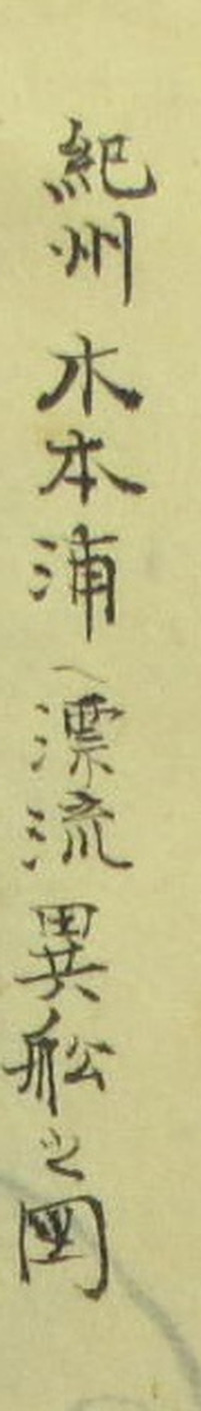紀州木本浦漂流異舩之圖

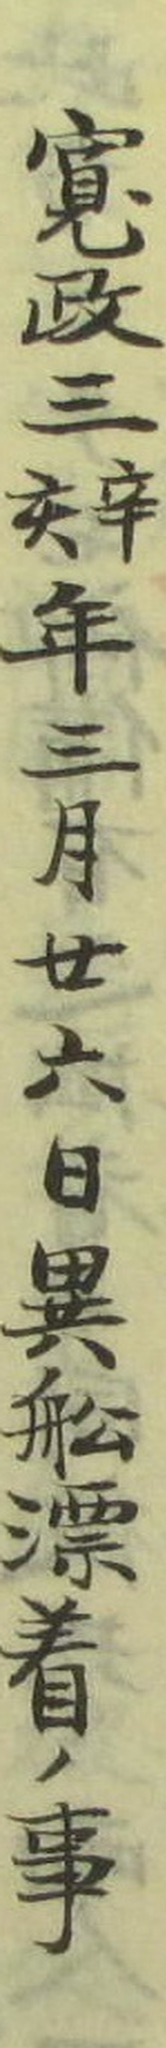寛政三辛亥年三月廿六日異舩漂着ノ事
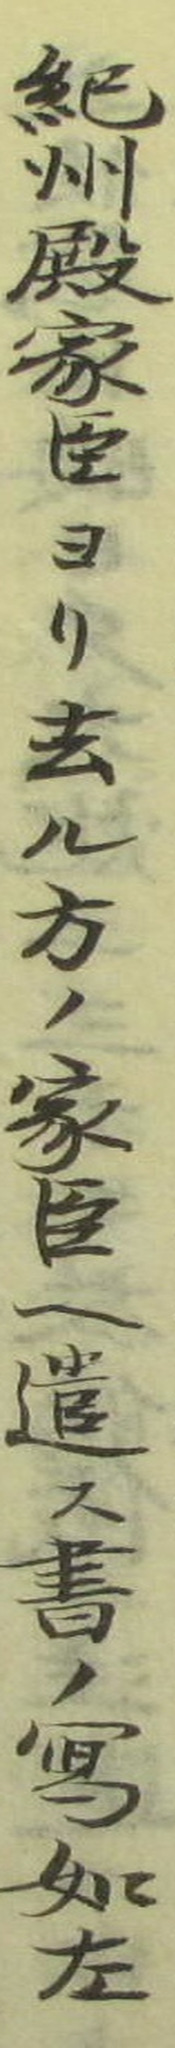紀州殿家臣ヨリ去ル方ノ家臣ヘ遣ス書ノ寫如左
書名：異国船漂着記 外二
